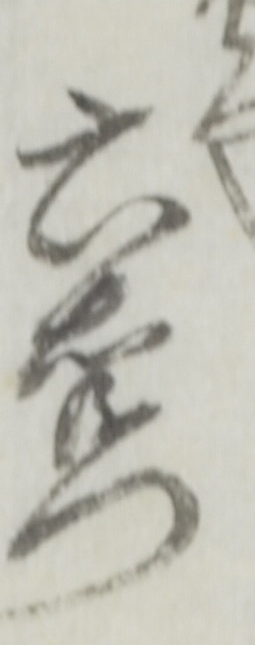六右衛門
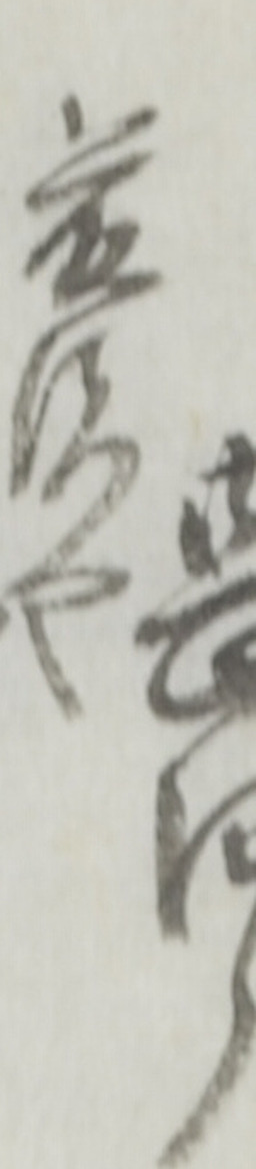藤沢や
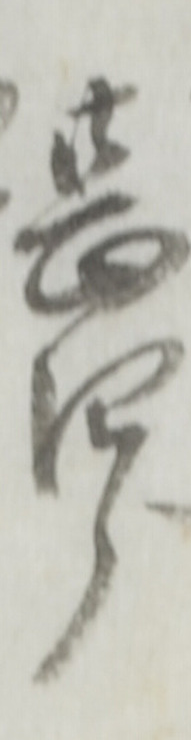甚四郎
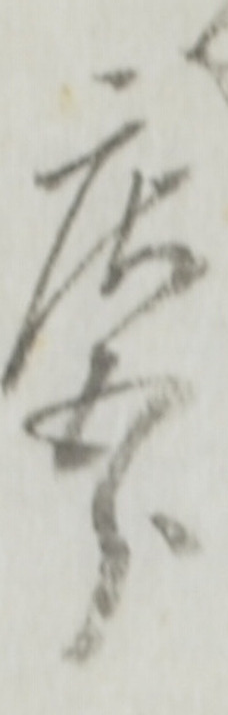庄五郎
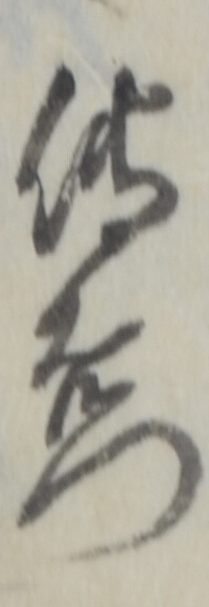善右衛門

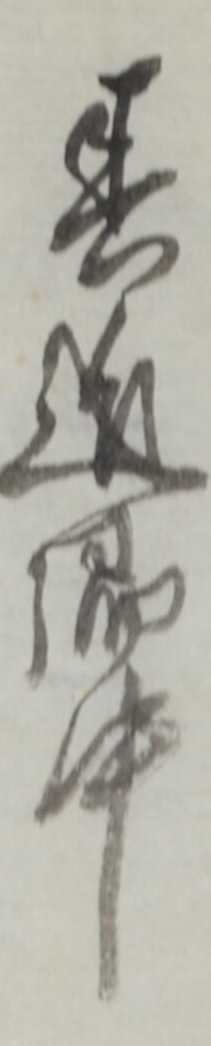春近郷中
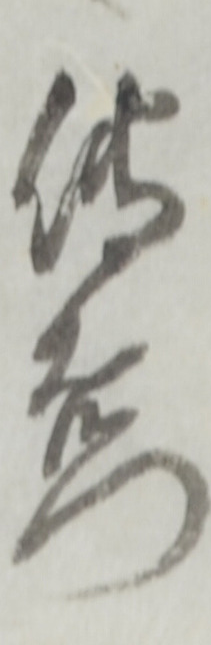伝右衛門
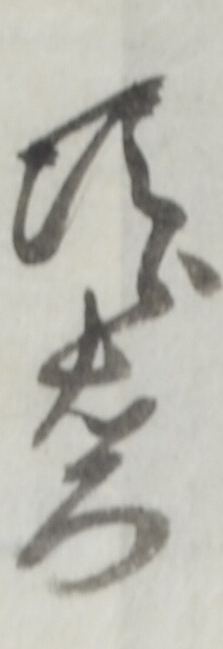次郎右衛門
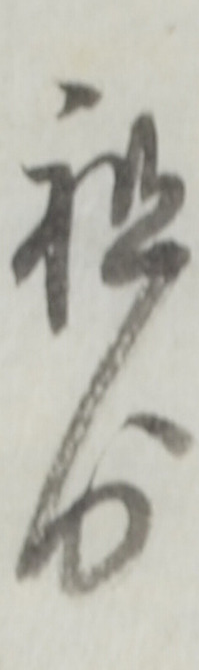伝右衛門
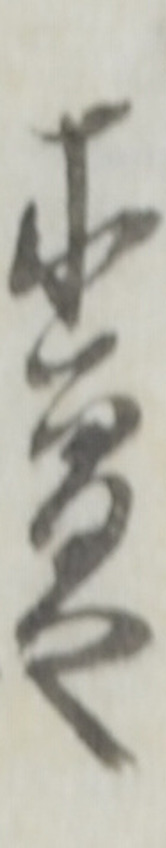木曽や
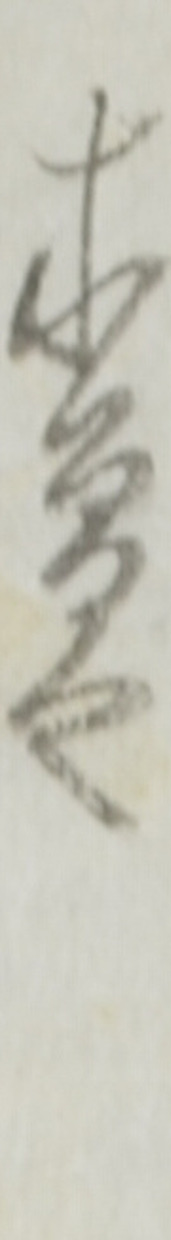木曽や
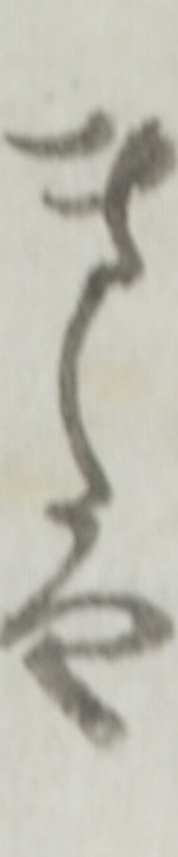きしや
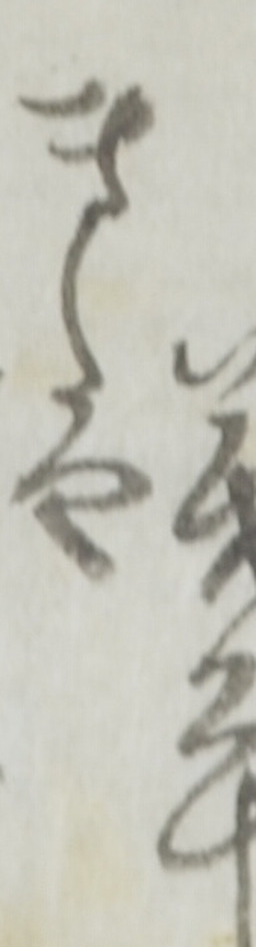きしや

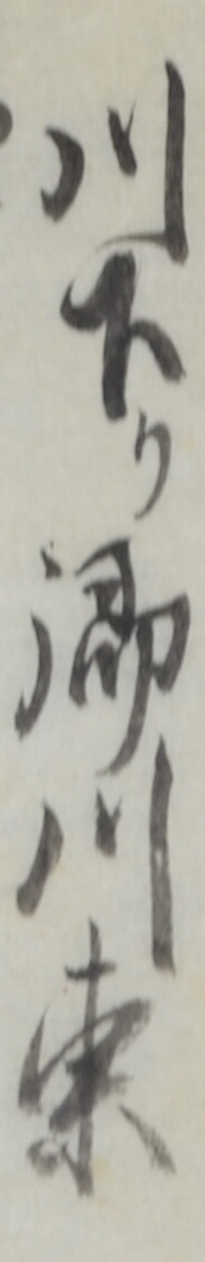川下り郷川東
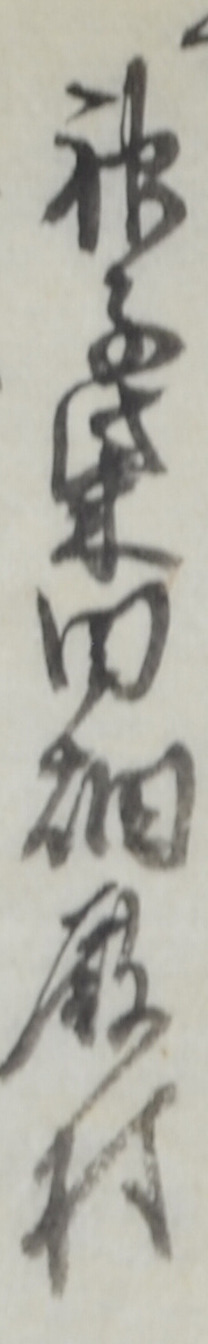神子柴田畑殿村
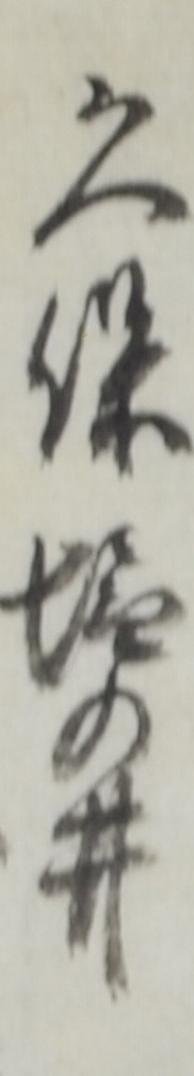久保塩の井
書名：勧化人割帳
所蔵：伊那市立高遠町図書館・合同会社AMANE
